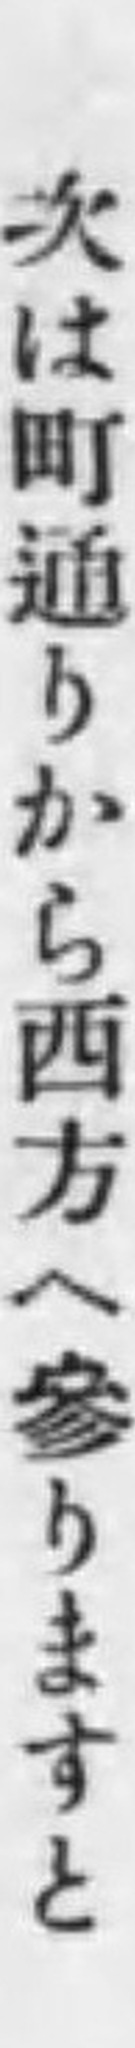次は町通りから西方へ参りますと
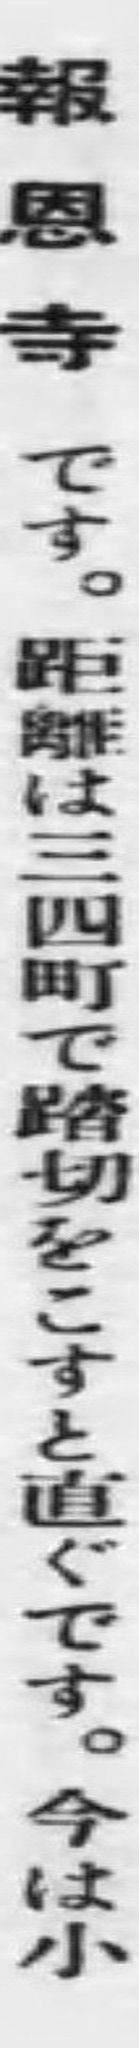報恩寺です。距離は三四町で踏切をこすと直ぐです。今は小
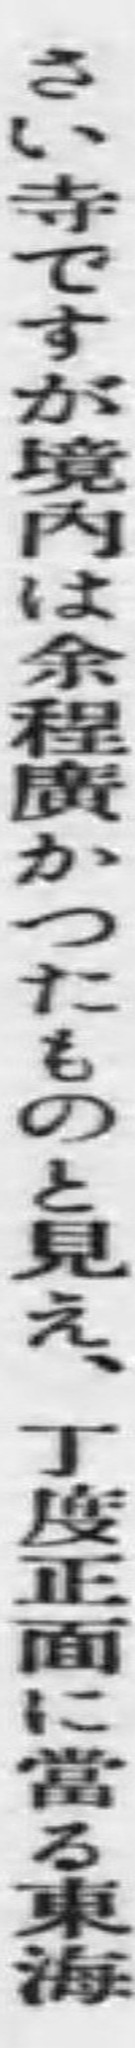さい寺ですが境内は余程広かつたものと見え、丁度正面に当る東海
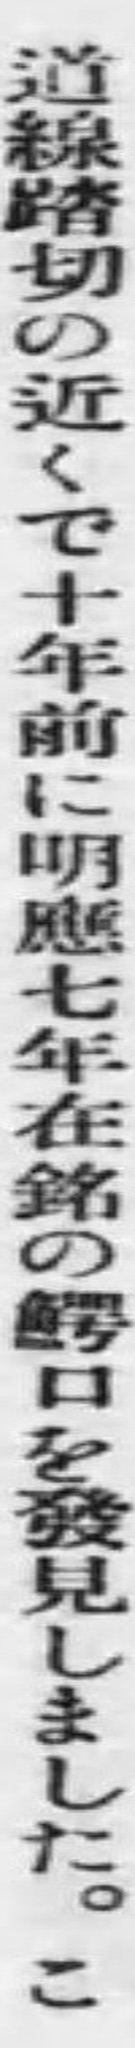道線踏切の近くで十年前に明応七年在銘の鰐口を発見しました。こ
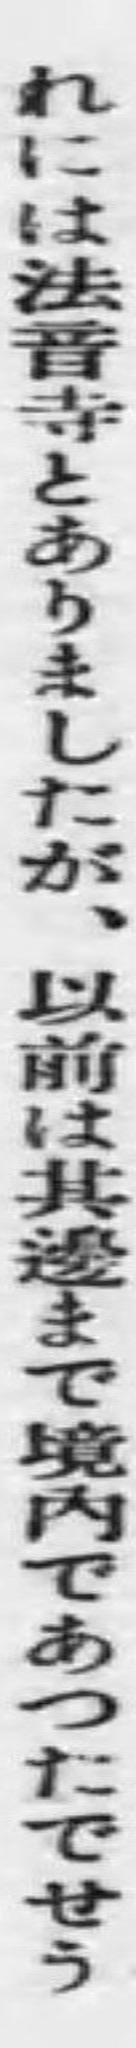れには法音寺とありましたが、以前は其辺まで境内であつたでせう
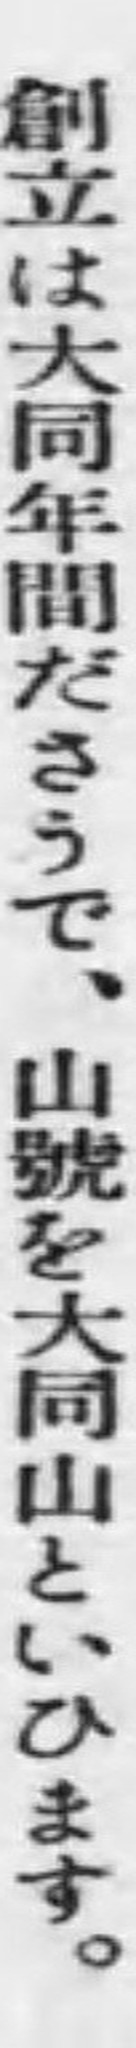創立は大同年間ださうで、山号を大同山といひます。
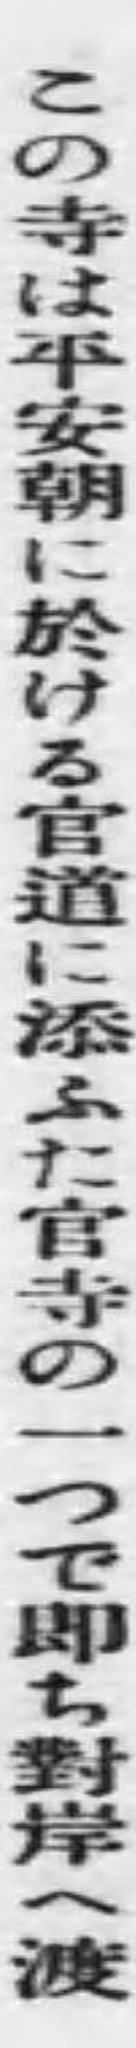この寺は平安朝に於ける官道に添ふた官寺の一つで即ち対岸へ渡
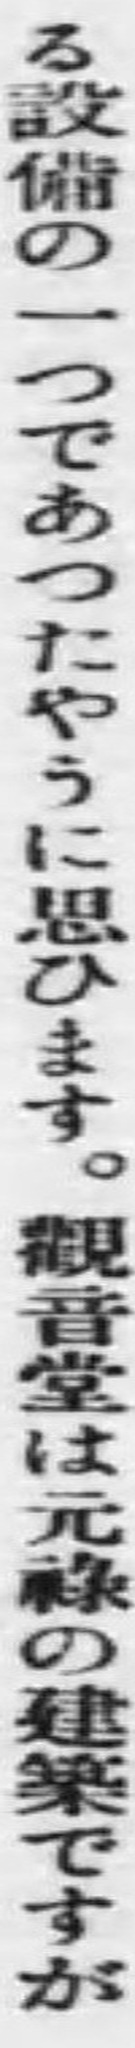る設備の一つであつたやうに思ひます。観音堂は元禄の建築ですが
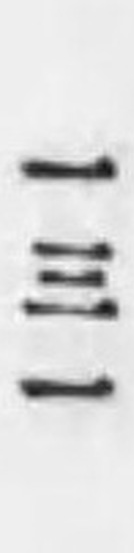一三一

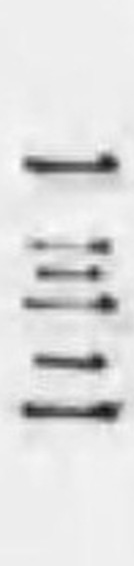一三二
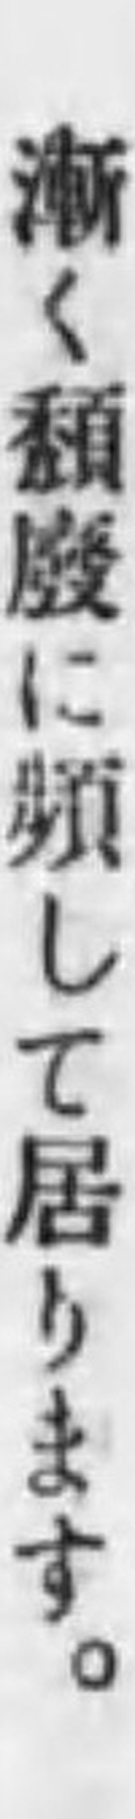漸く頽廃に頻して居ります。
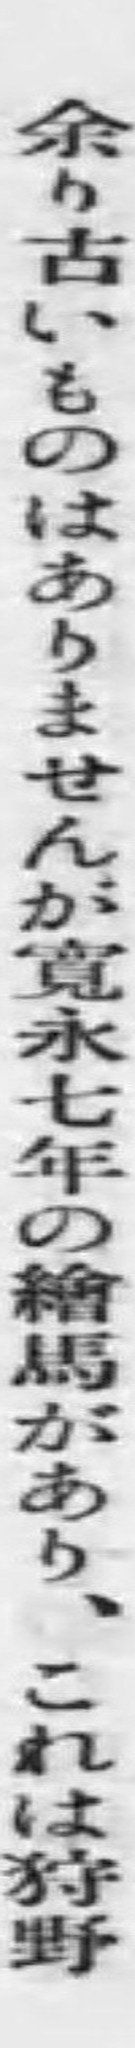余り古いものはありませんが寛永七年の絵馬があり、これは狩野
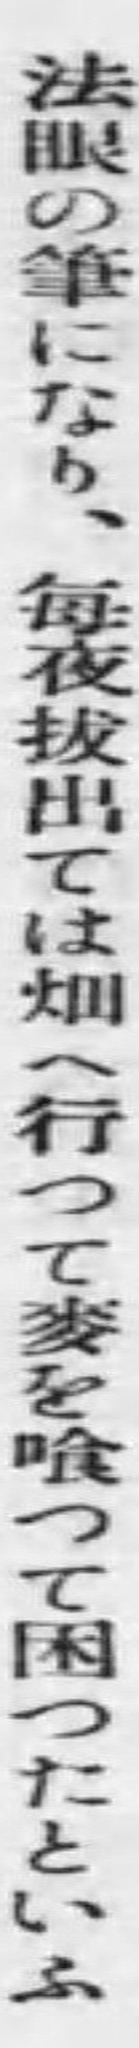法眼の筆になり、毎夜抜出ては畑へ行つて麦を喰つて困つたといふ
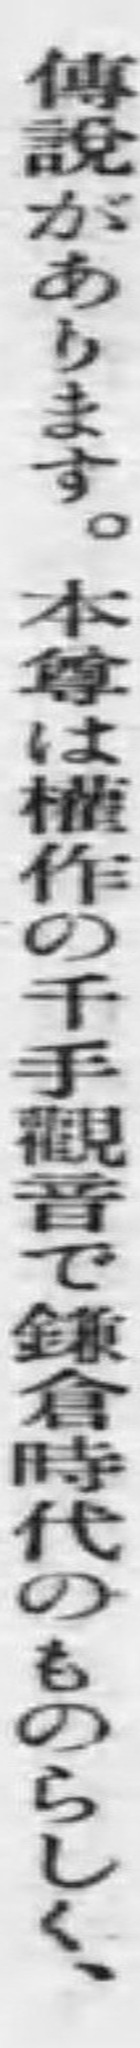伝説があります。本尊は権作の千手観音で鎌倉時代のものらしく、
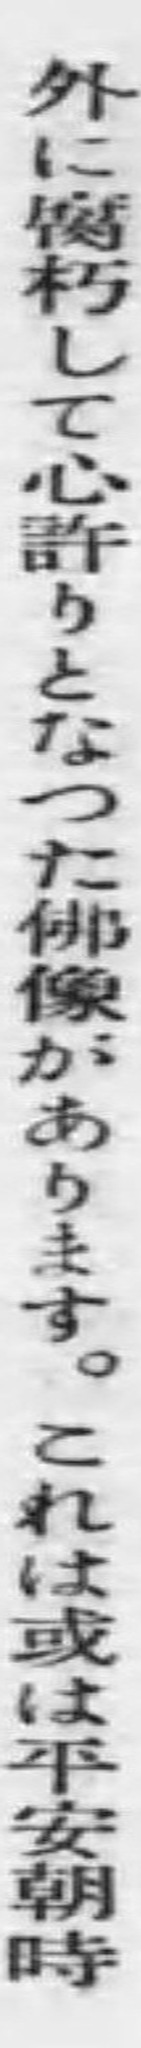外に腐朽して心許りとなつた仏像があります。これは或は平安朝時
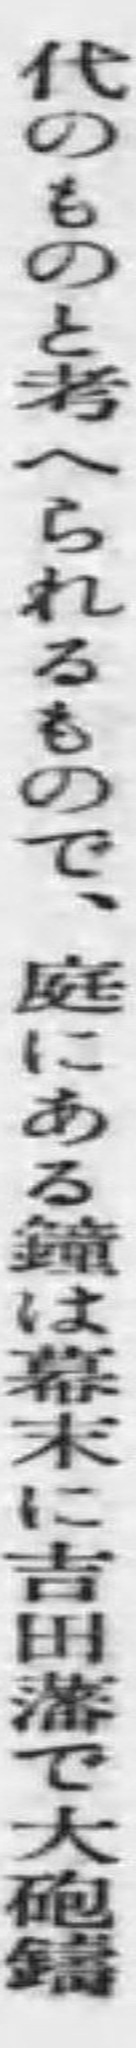代のものと考へられるもので、庭にある鐘は幕末に吉田藩で大砲鋳
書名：東三河道中記 : 豊橋市及其附近案内
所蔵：国立国会図書館 National Diet Library, JAPAN
